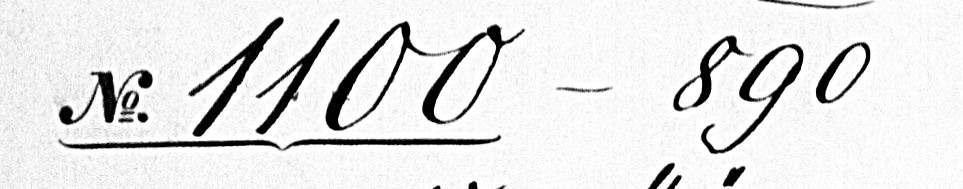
N° 1100 - 890
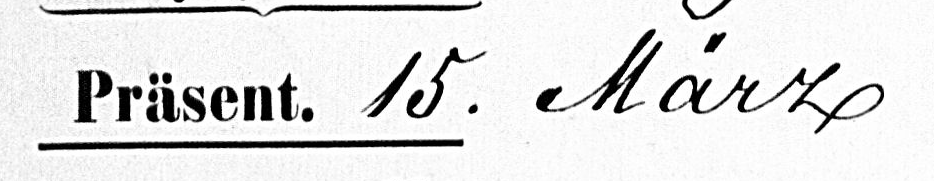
Präsent. 15. März
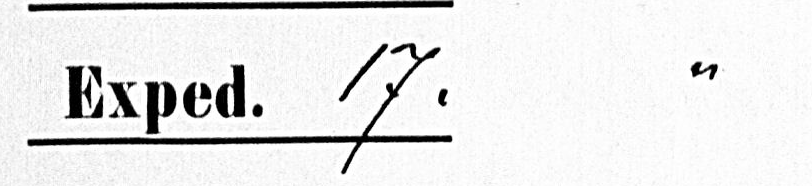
Exped. 17. März
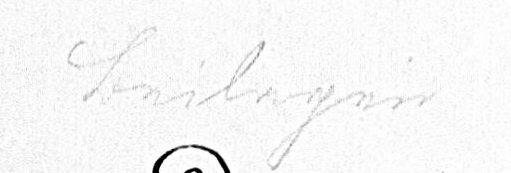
Beilegen
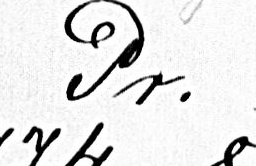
Pr.
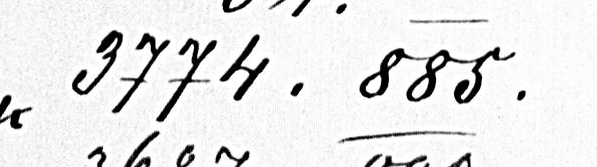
3774. 885.
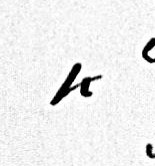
k
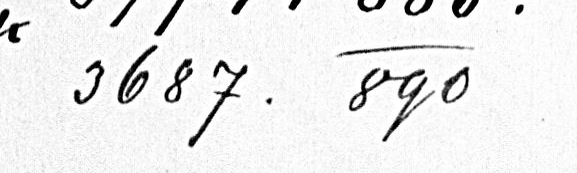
3687. 890
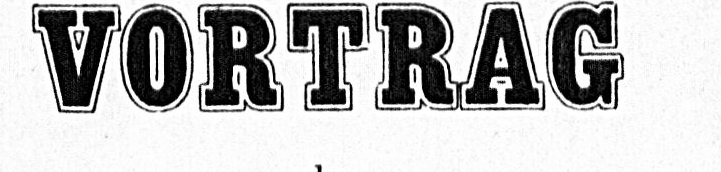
VORTRAG
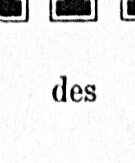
des
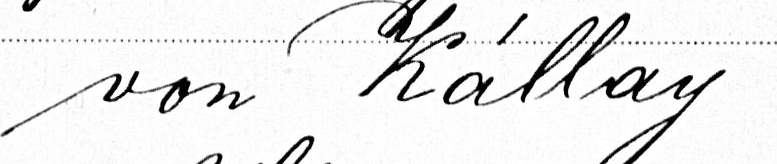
von Kállay
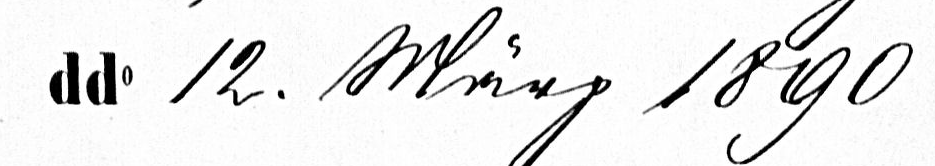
dd° 12. März 1890
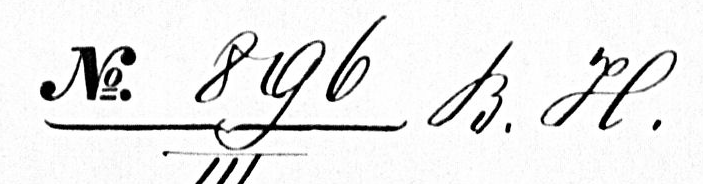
N°. 896 B. H.
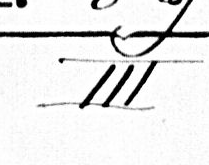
III
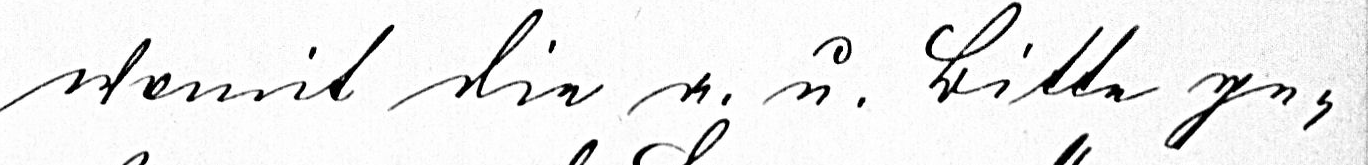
Womit die a. u. Bitte ge¬
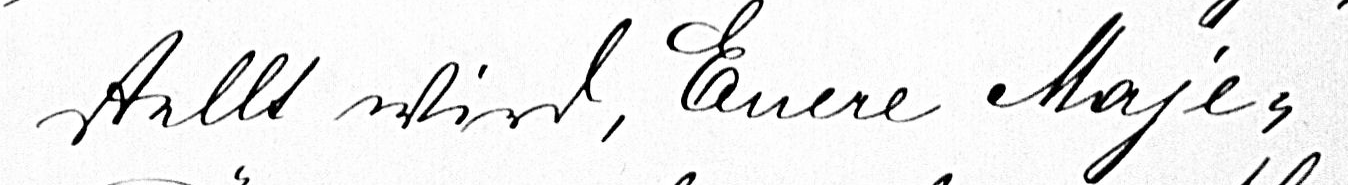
stellt wird, Euere Maje¬
